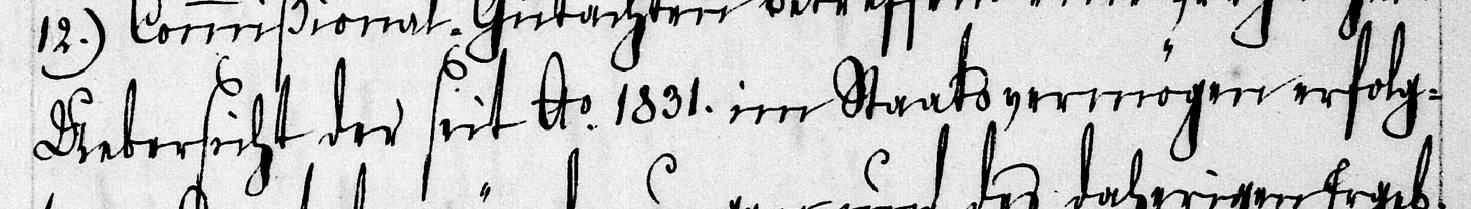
Uebersicht der seit Ao. 1831 im Staatsvermögen erfolg¬
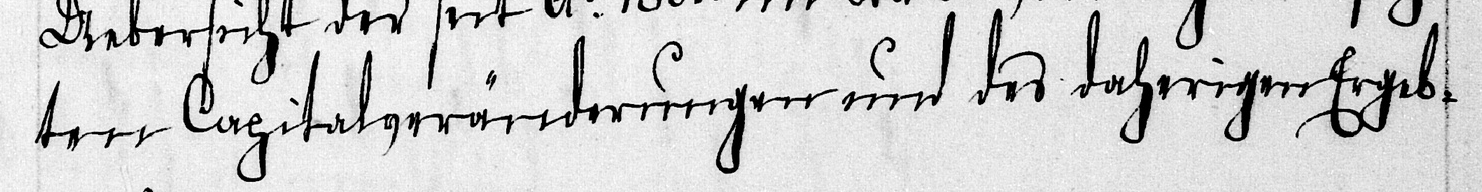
ten Capitalveränderungen und des daherigen Ergeb¬
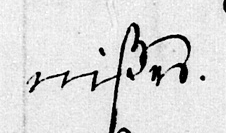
nißes.
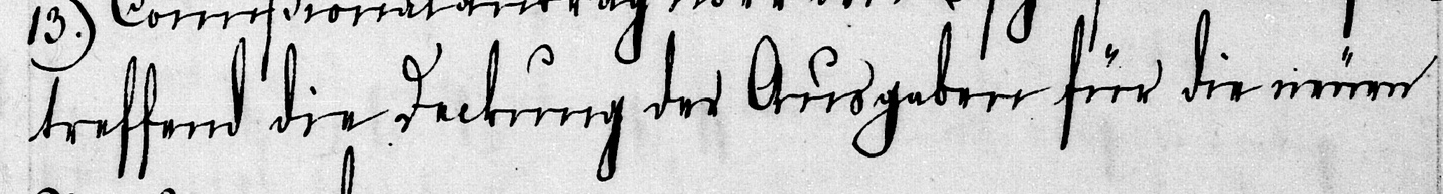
treffend die Deckung der Ausgaben für die neuen
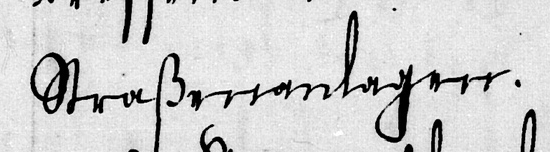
Straßenanlagen.
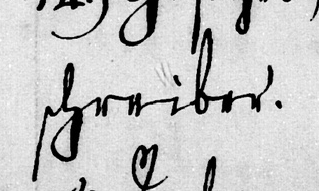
schreiber.
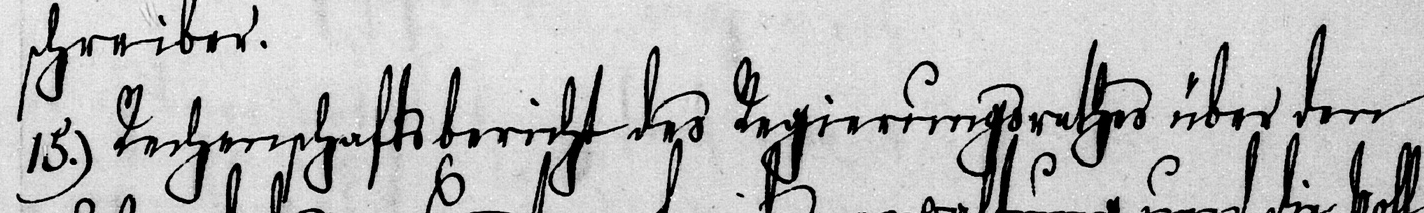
15.) Rechenschaftsbericht des Regierungsrathes über den
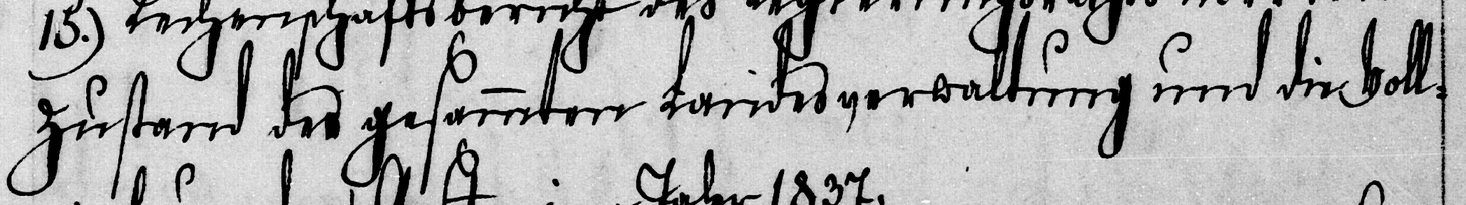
Zustand der gesammten Landesverwaltung und die Vol¬
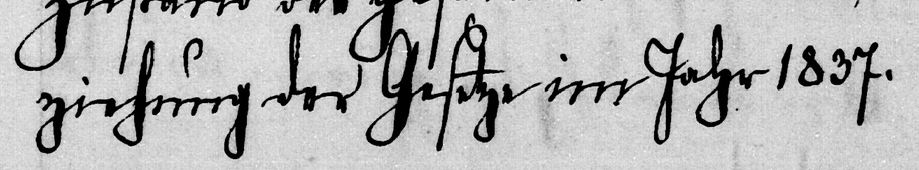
lziehung der Gesetze im Jahr 1837.
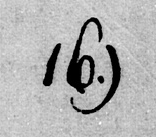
14.)
